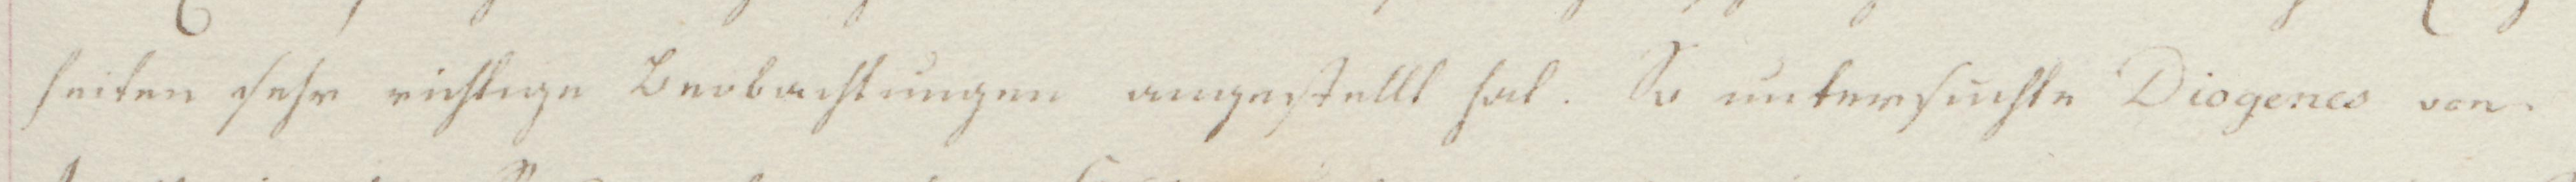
heiten sehr richtige Beobachtungen angestellt hat. So untersuchte Diogenes von
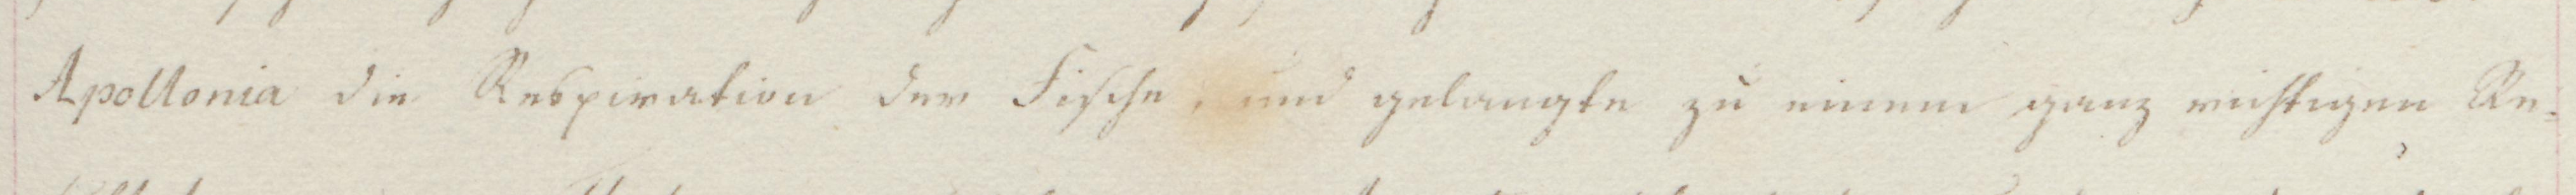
Apollonia die Respiration der Fische, und gelangte zu einem ganz richtigen Re-
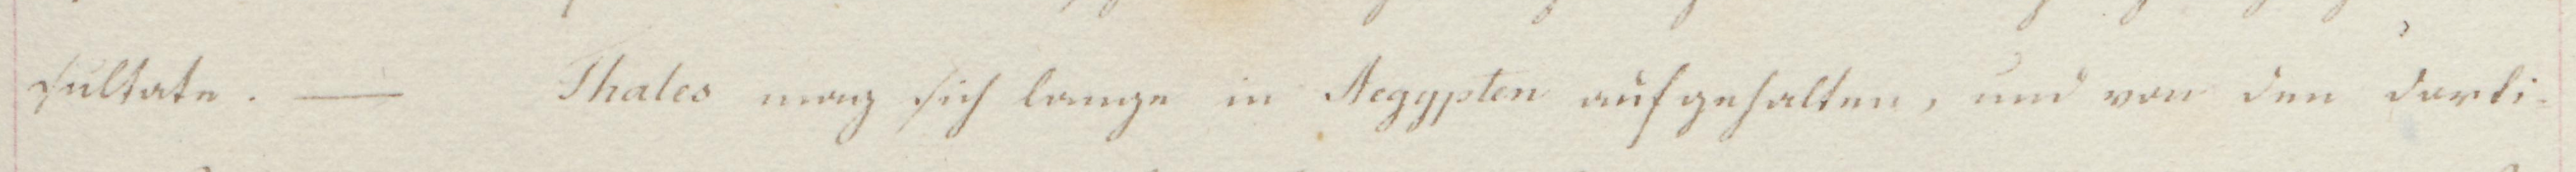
sultate. – Thales mag sich lange in Aegypten aufgehalten, und von den dorti-
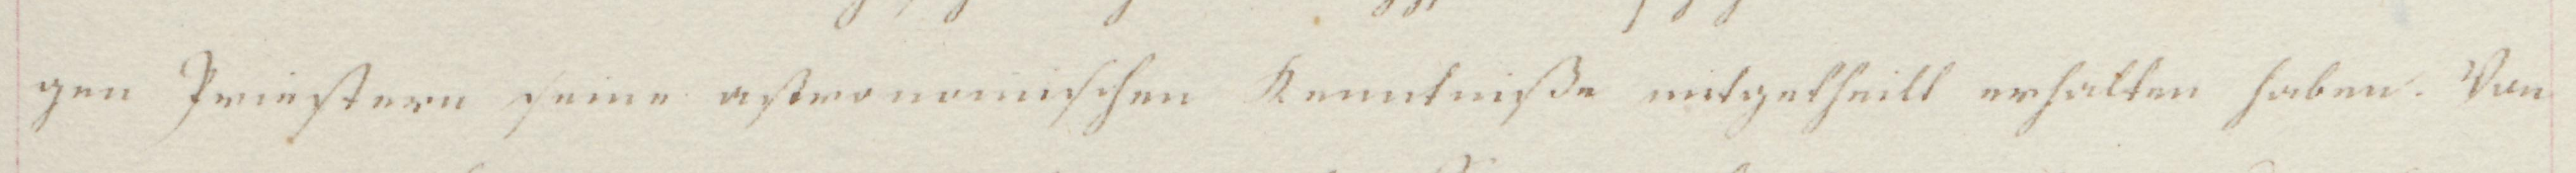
gen Priestern seine astronomischen Kenntniße mitgetheilt erhalten haben. Von
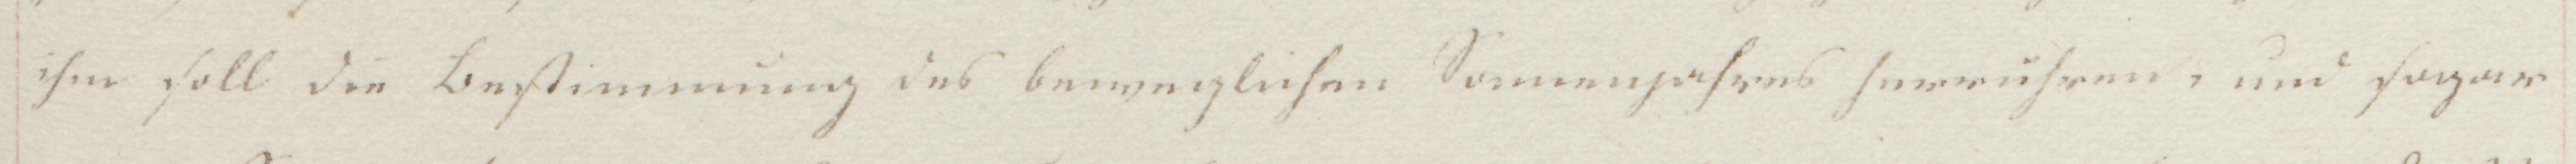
ihm soll die Bestimmung des beweglichen Sonnenjahres herrühren, und sogar
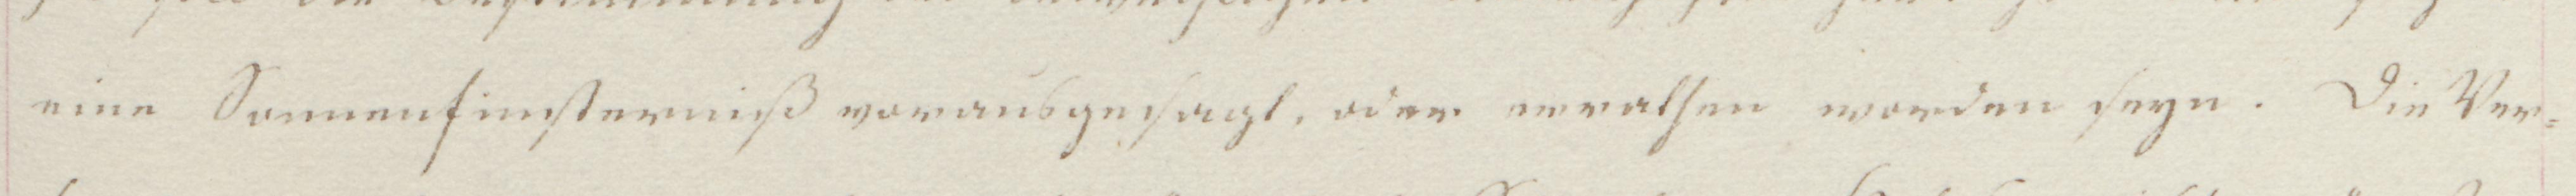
eine Sonnenfinsterniß vorausgesagt, oder errathen worden seyn. Die Ver-
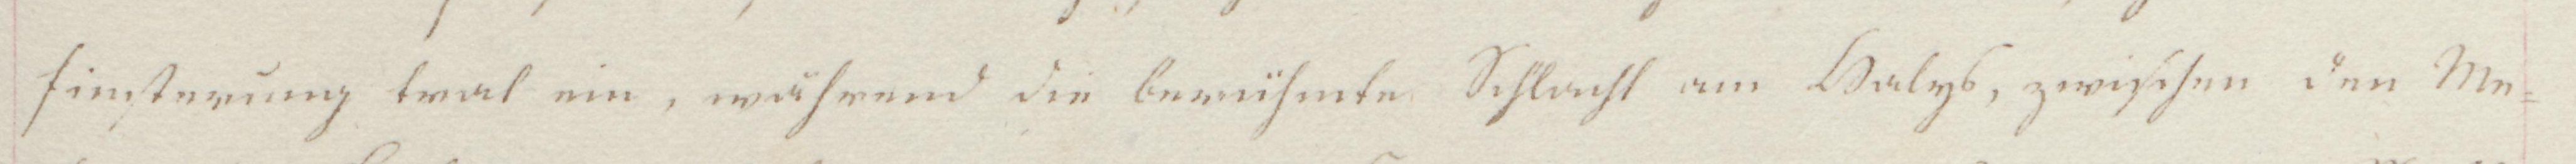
finsterung trat ein, während die berühmte Schlacht am Halys, zwischen den Me-
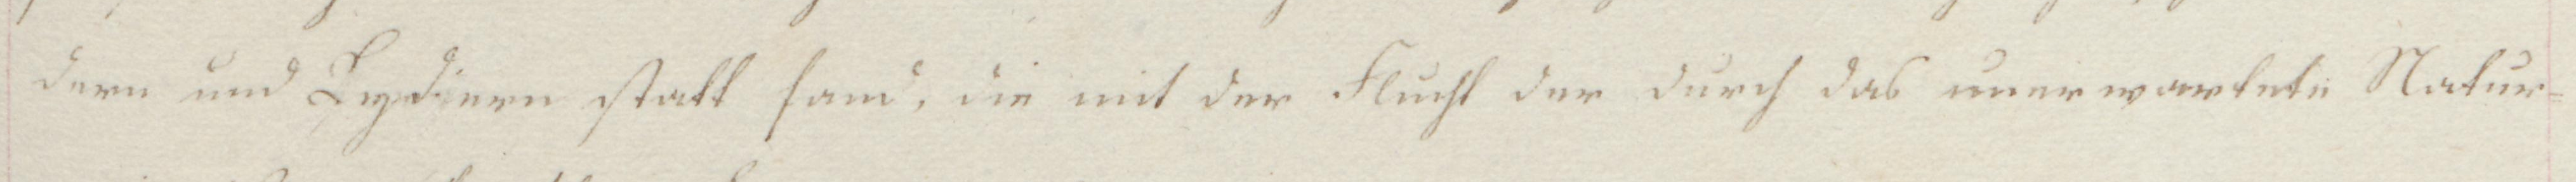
dern und Lydiern statt fand, die mit der Flucht der durch das unerwartete Natur-
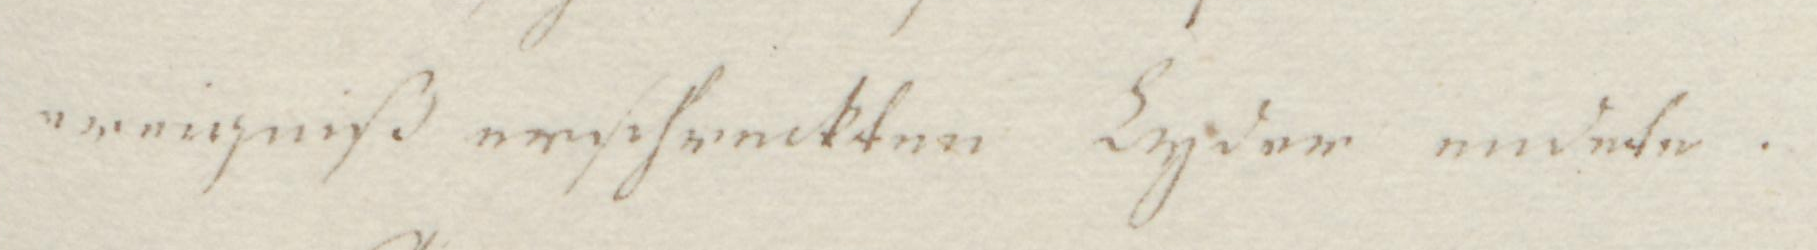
ereigniß erschreckten Lyder endete.
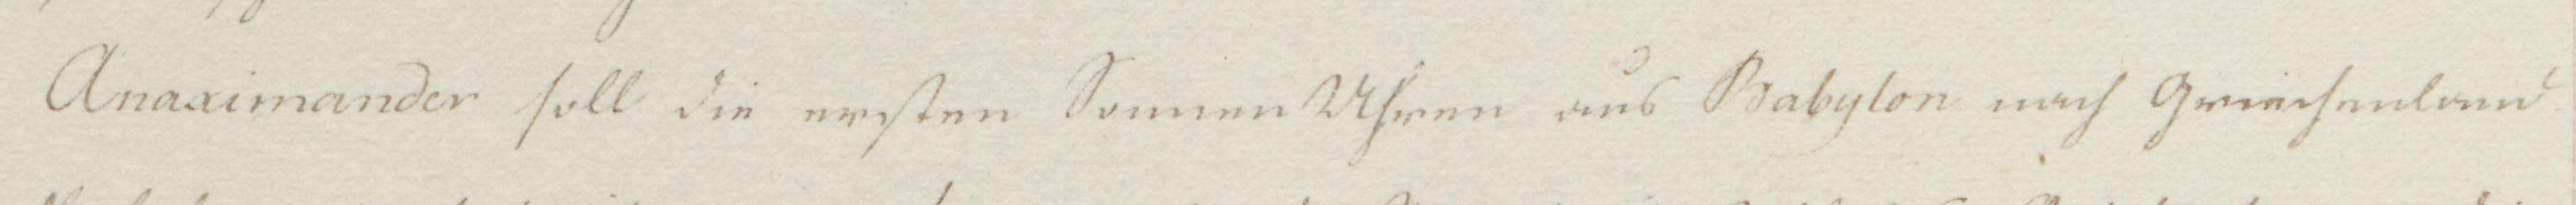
Anaximander soll die ersten Sonnen Uhren aus Babylon nach Griechenland
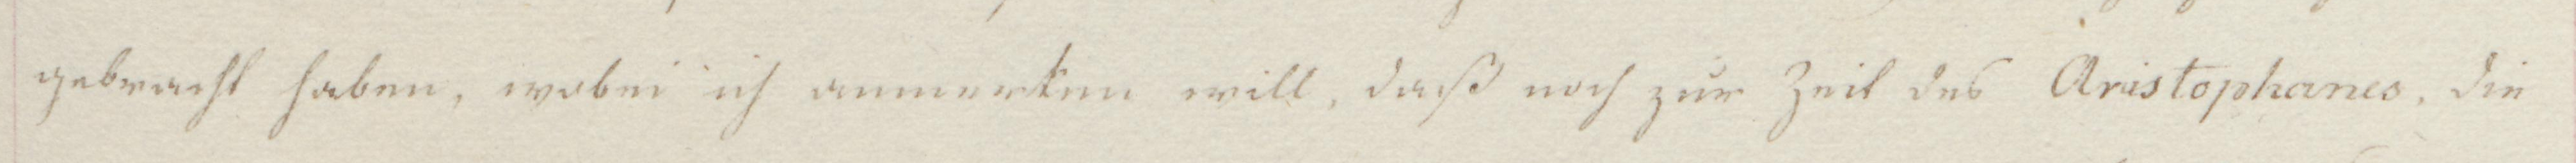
gebracht haben, wobei ich anmerken will, daß noch zur Zeit des Aristophanes, die
